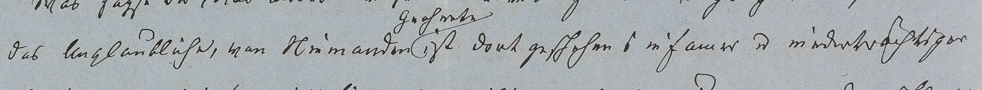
Das Unglaubliche, von Niemanden Geahnete ist dort geschehen; infamer & niederträchtiger
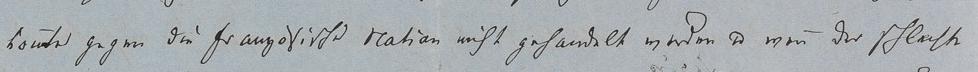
konnte gegen die französische Nation nicht gehandelt werden & wenn der schlechte
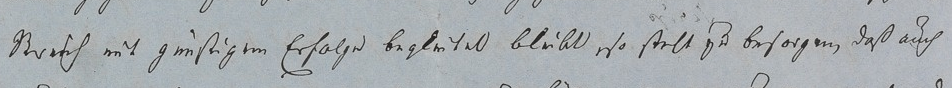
Streich mit günstigem Erfolge begleitet bleibt, so steht zu besorgen, daß auch
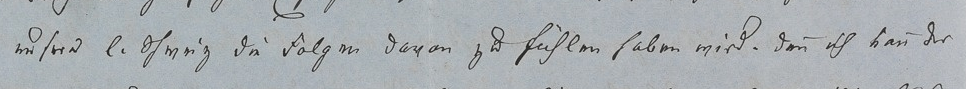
unsere l. Schweiz die Folgen davon zu fühlen haben wird. Denn ich kann der
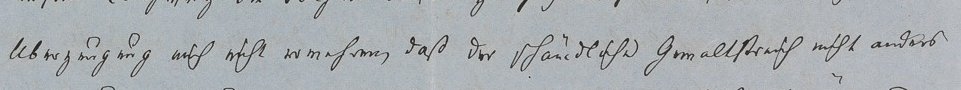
Uberzeugung mich nicht erwehren, daß der schändliche Gewaltstreich nicht anders
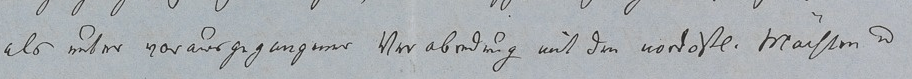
als unter vorausgegangener Verabredung mit den nordöstl. Mächten &
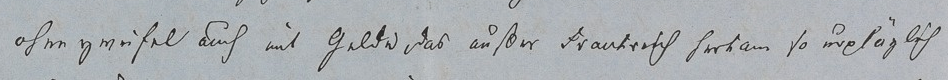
ohne Zweifel auch mit Gelde, das außer Frankreich herkam so urplötzlich
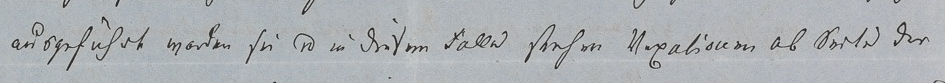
ausgeführt worden sei & in diesem Falle stehen Vexationen ab Seite der
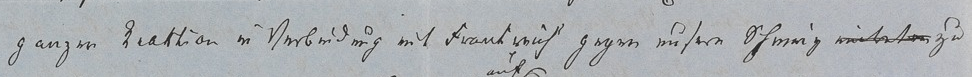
ganzen Reaktion in Verbindung mit Frankreich gegen unsere Schweiz eintreten zu
